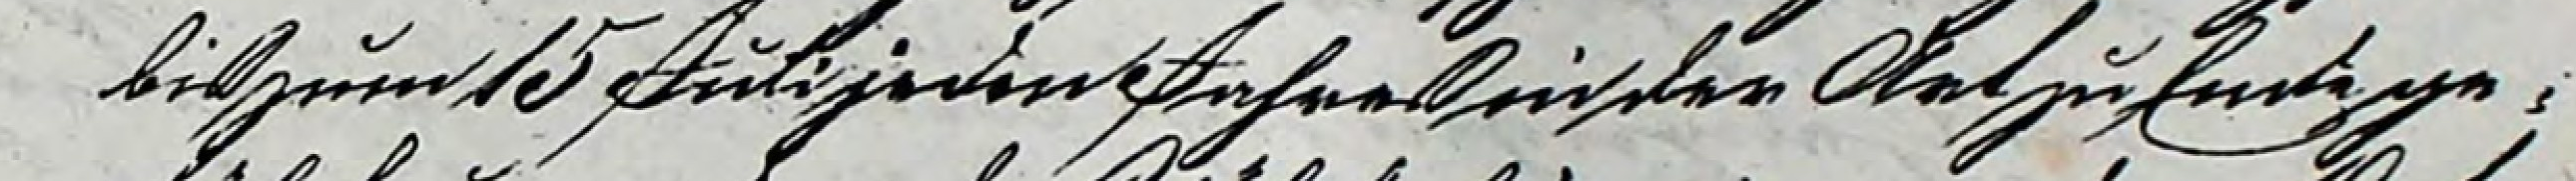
bis zum 15 Juli jeden Jahres in der Art zu Ende ge„
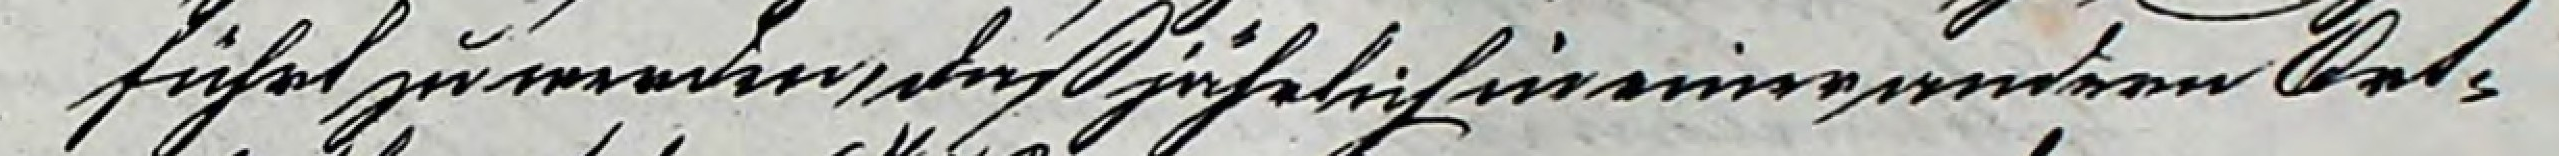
führt zu werden, daß jährlich in einer andern Ort„
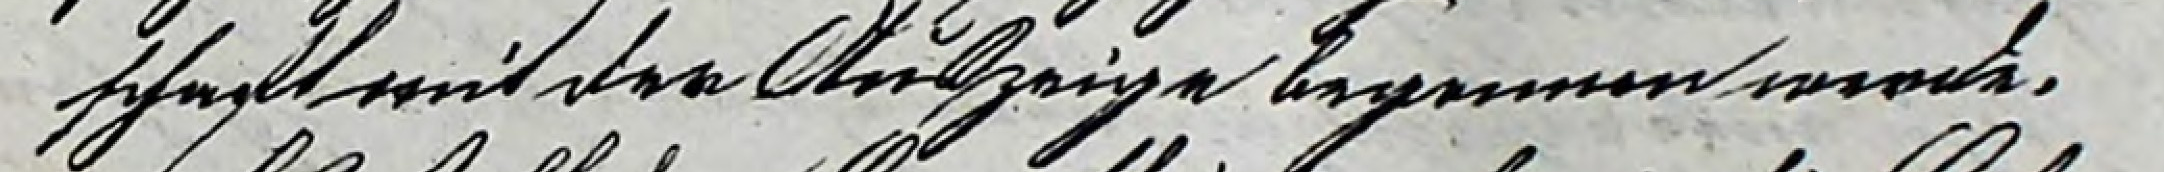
schaft mit der Auszeige begennen werde.
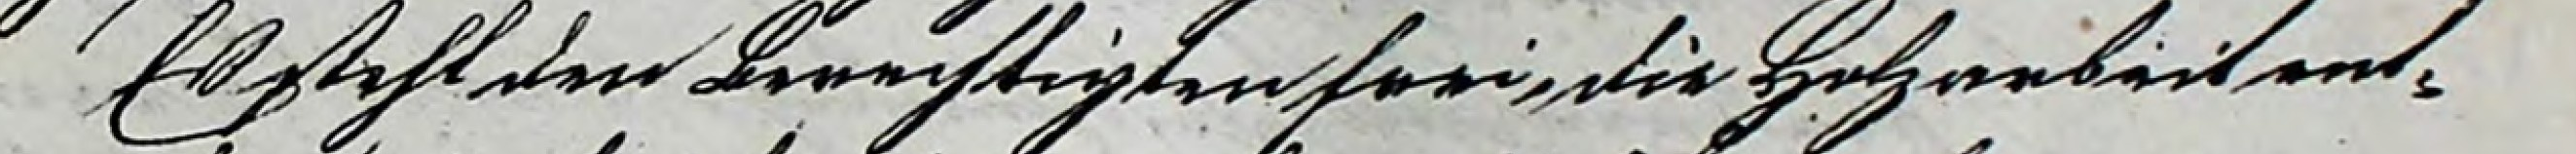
Es stehl den Berechtigten frei, die Holzarbeit ent„
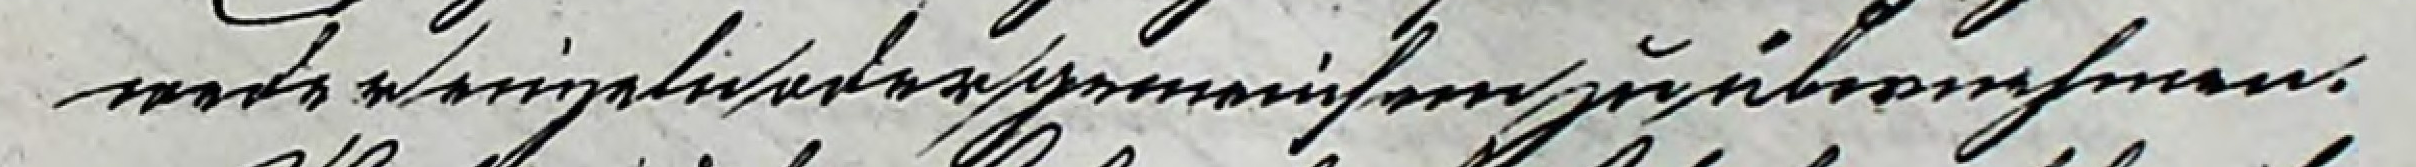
werder enigeln oder gemeinhem zu übernehmen.
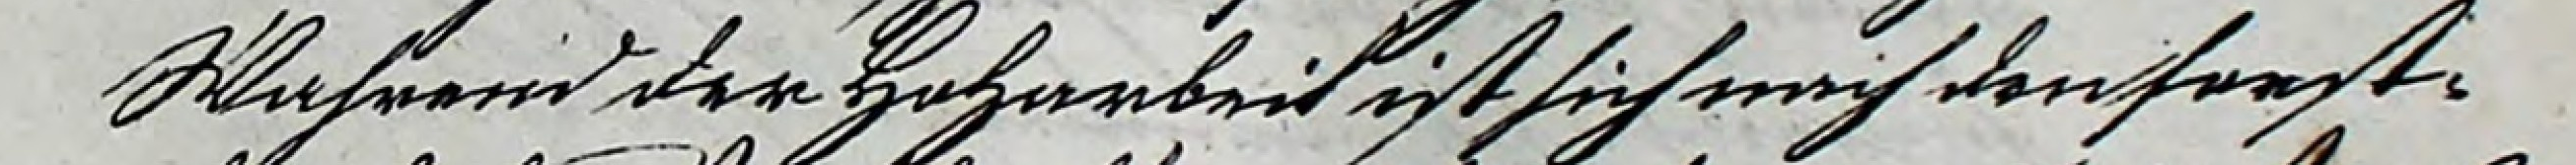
Wahrend der Holzarbeit ist sich nach den forst„
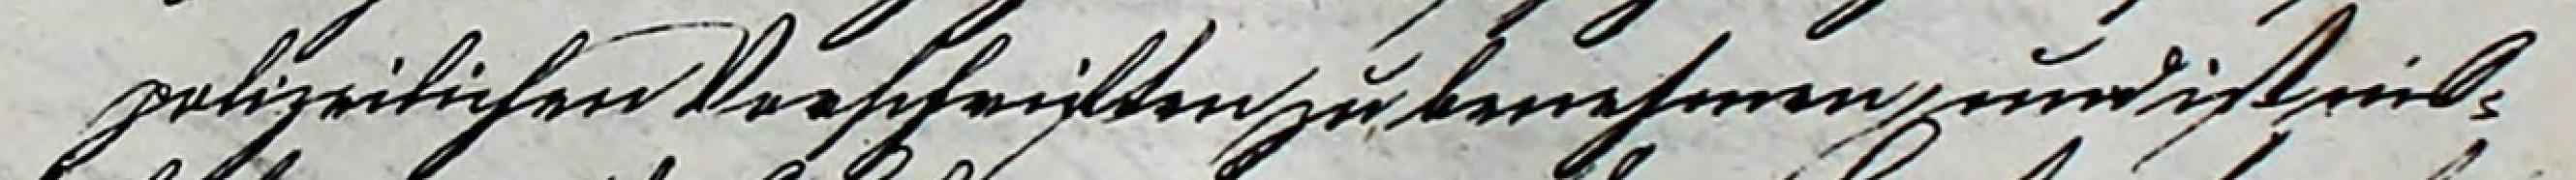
polizeilichen Verschriften zu benehmen, und ist ins„
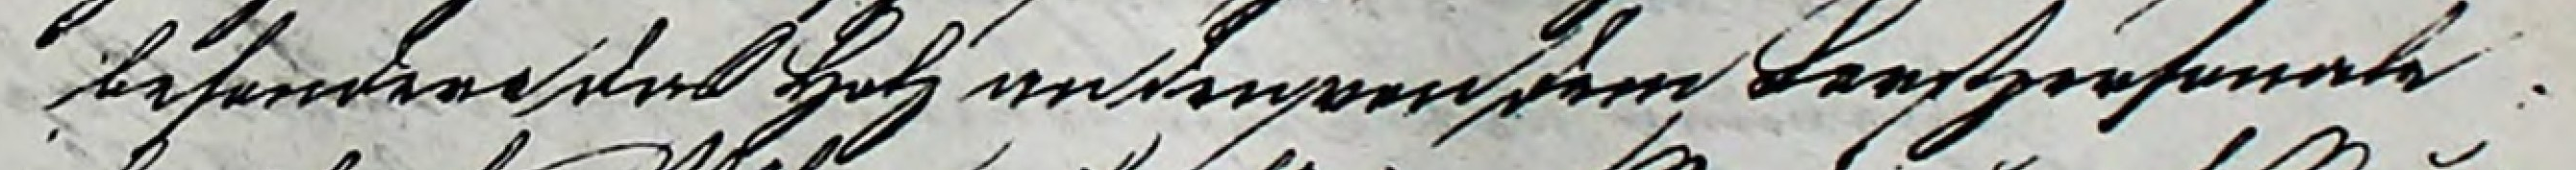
besondere das Holz an den von dem Lerstpersonale
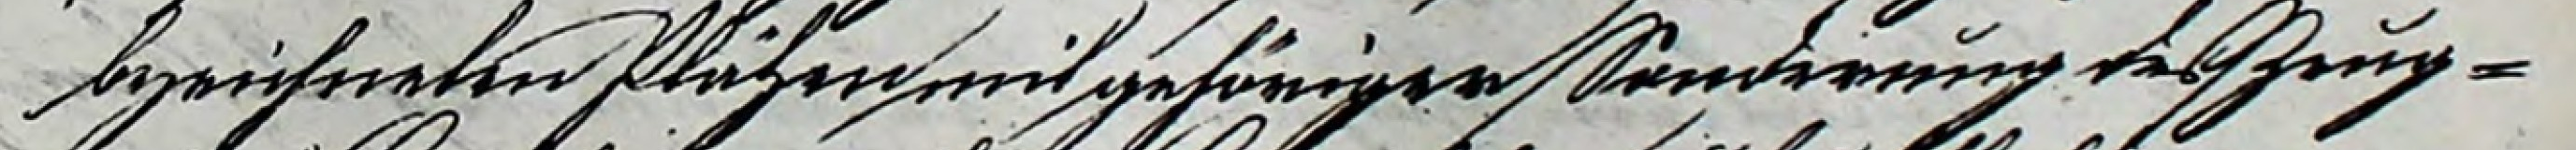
Bezeichneten Plätzen mit gehöriger Sonderung des Zeug=
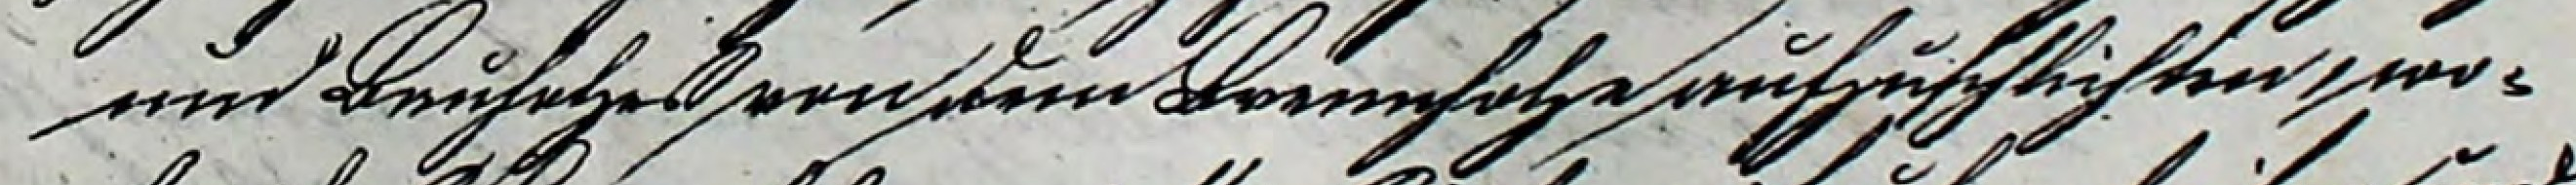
und Bauholzes von dem Brennholze aufzuschlichten, wo„
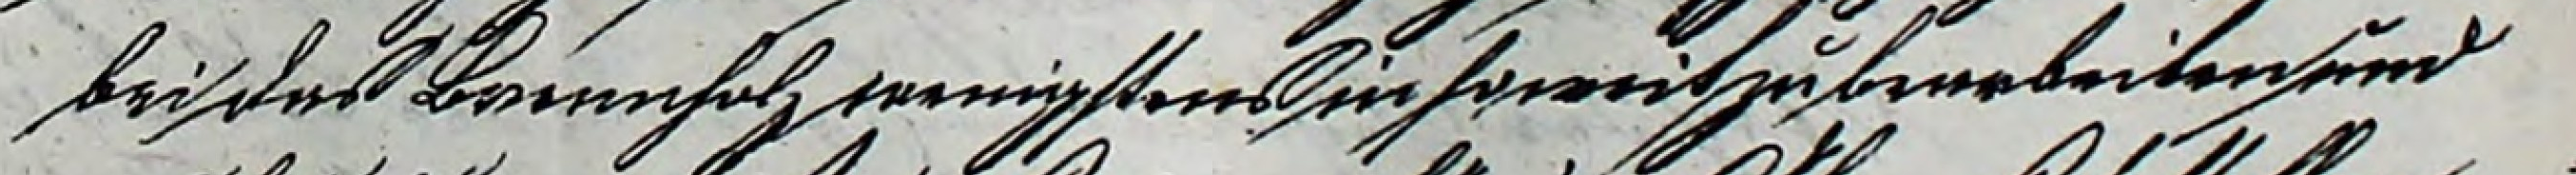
bei das Brennholz wenigstens in so weit zu bearbeiten und
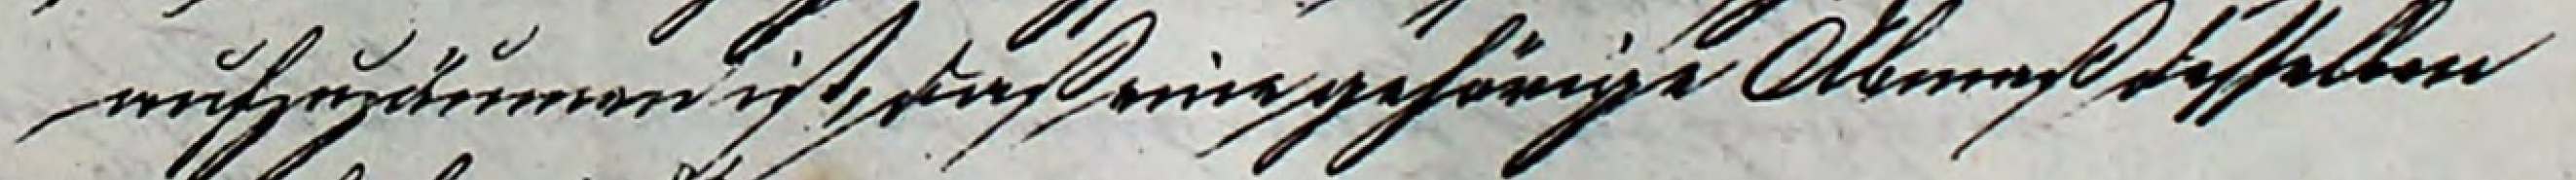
aufzuzitumen ist, daß eine gehörige Abmaß desselben
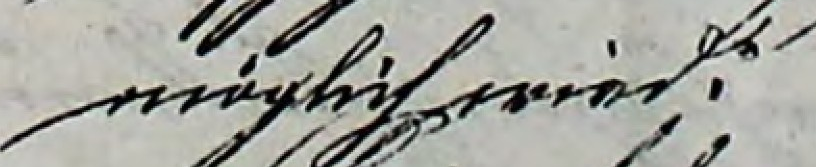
möglich wird.
